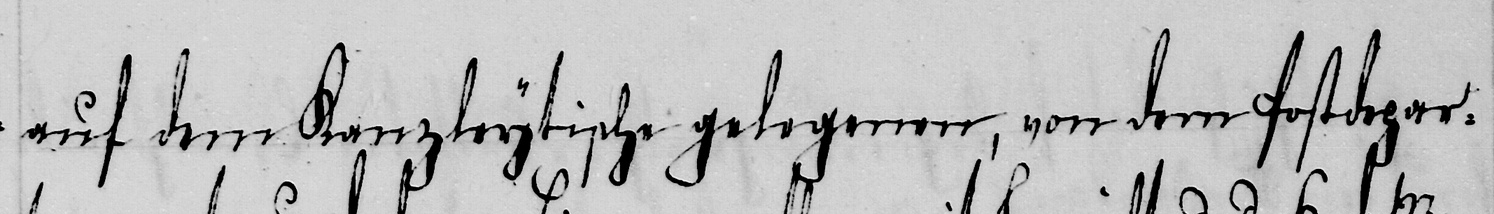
auf dem Kanzleytische gelegenen, von dem Postdepar¬
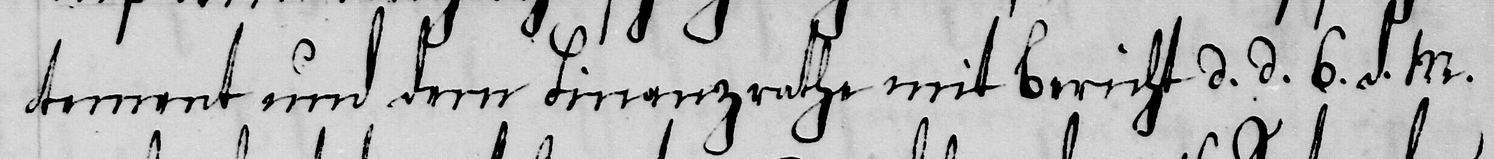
tement und dem Finanzrathe mit Bericht d. d. 6. d. M.
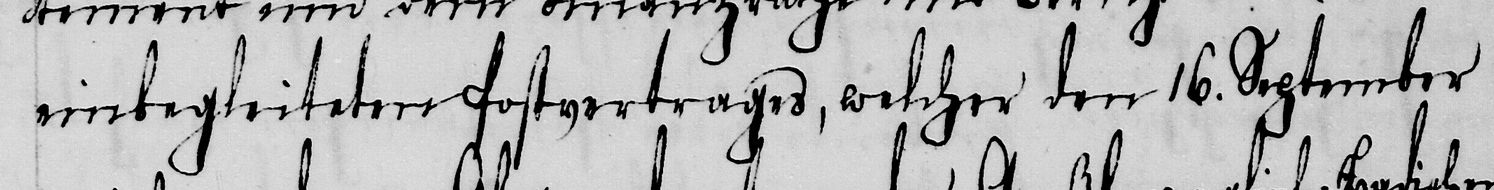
einbegleiteten Postvertrages, welcher den 16. September
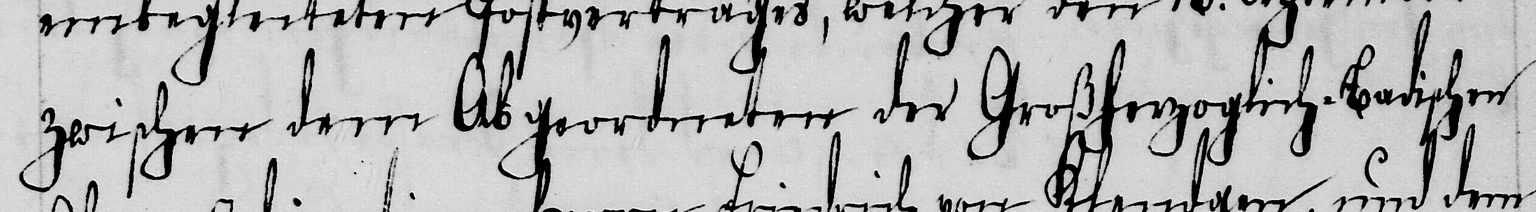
zwischen dem Abgeordneten der Großherzoglich-Badischen
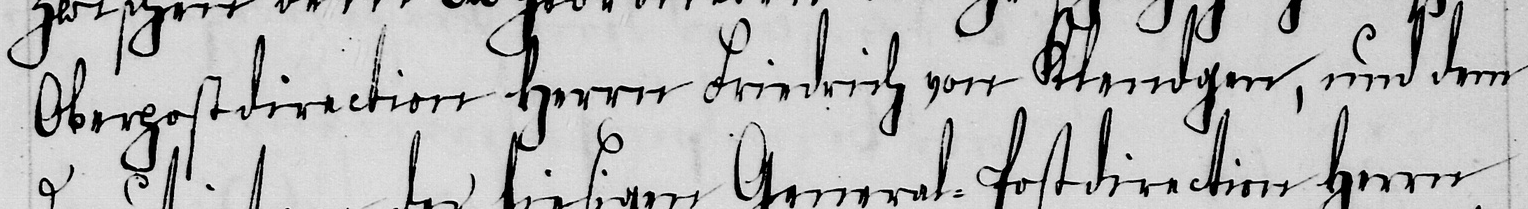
Oberpostdirection Herrn Friedrich von Klendgen, und dem
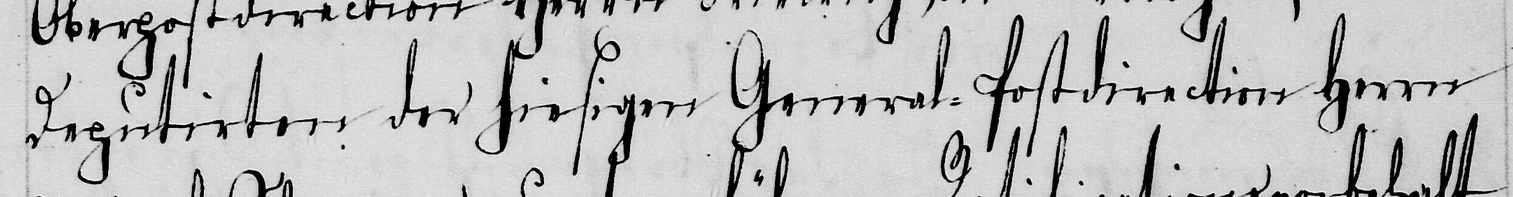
Deputirten der hiesigen General-Postdirection Herrn
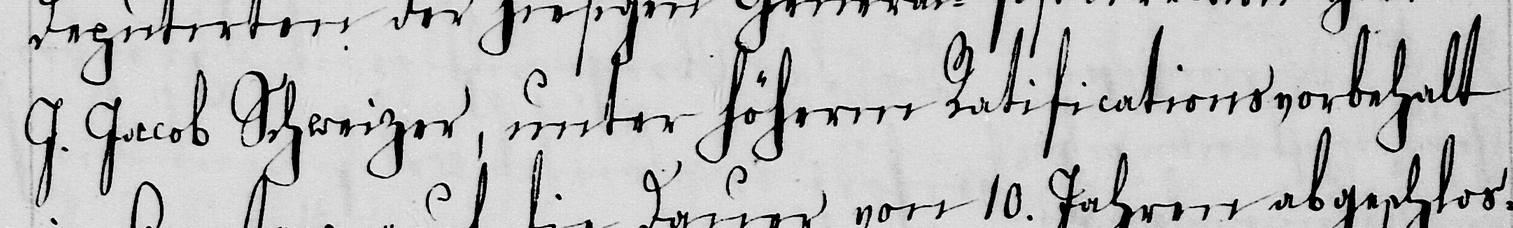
J. Jacob Schweizer, unter höherm Ratificationsvorbehalt
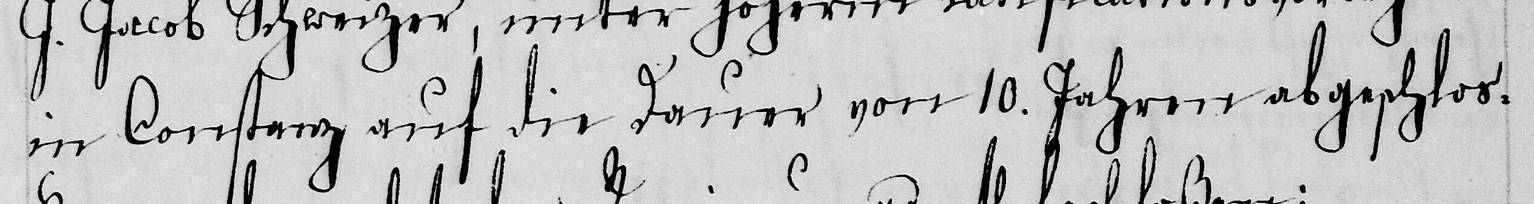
in Constanz auf die Dauer von 10. Jahren abgeschlo¬
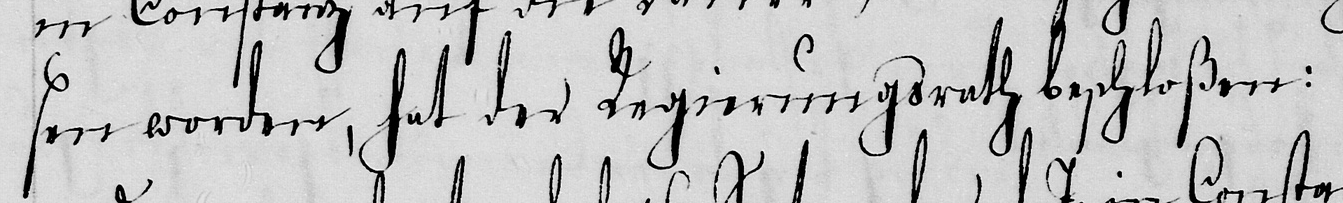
ßen worden, hat der Regierungsrath beschloßen:
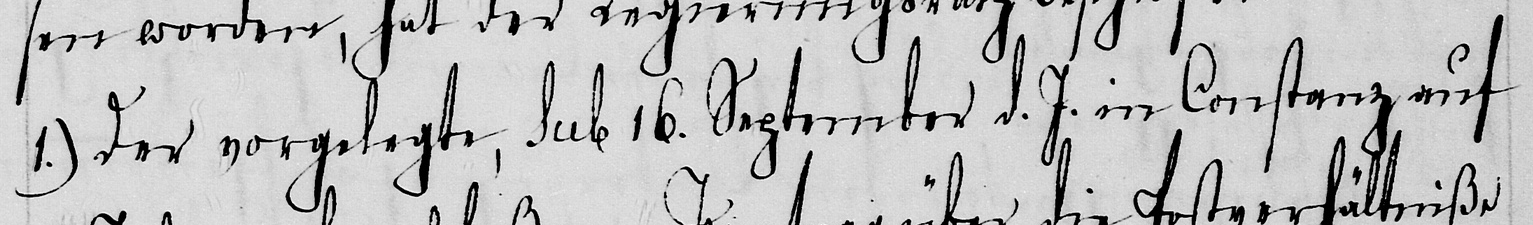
1.) Der vorgelegte, sub 16. September d. J. in Constanz auf
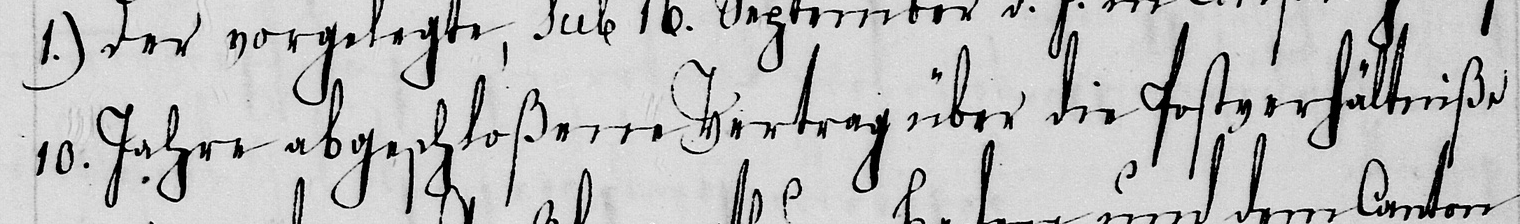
10. Jahre abgeschloßene Vertrag über die Postverhältniße
